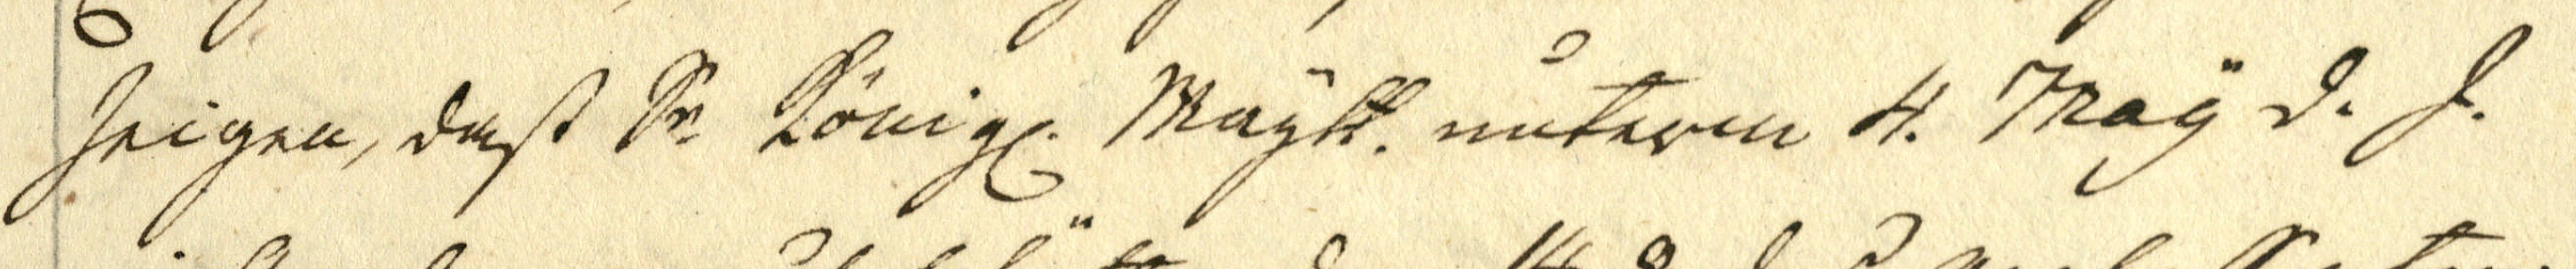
zeigen, daß Sr. Königl. Maÿtt. unterm 4. Maÿ d. J.
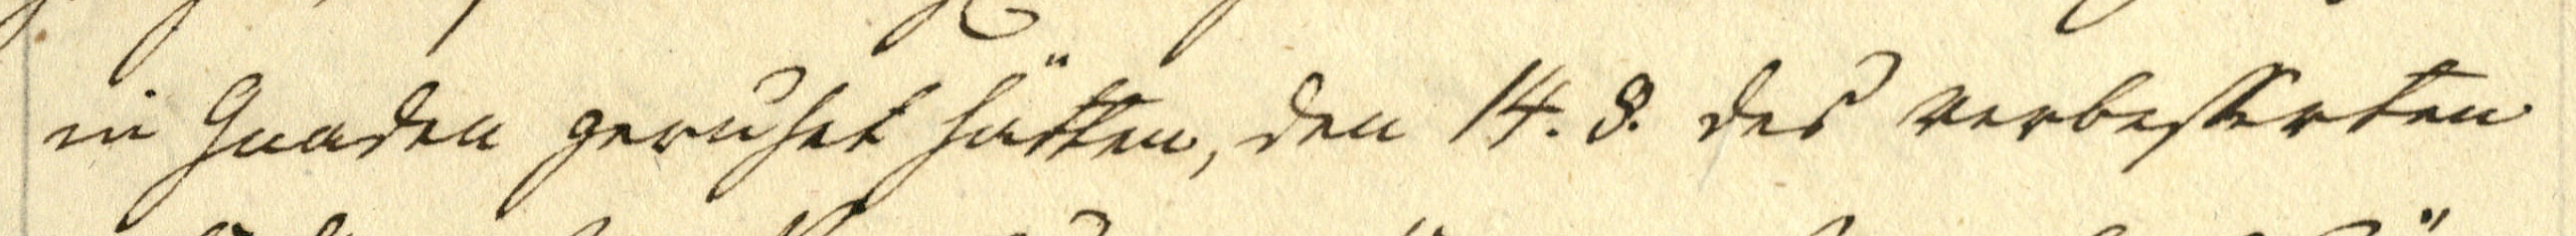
in Gnaden geruhet hätten, den 14. § des verbesserten
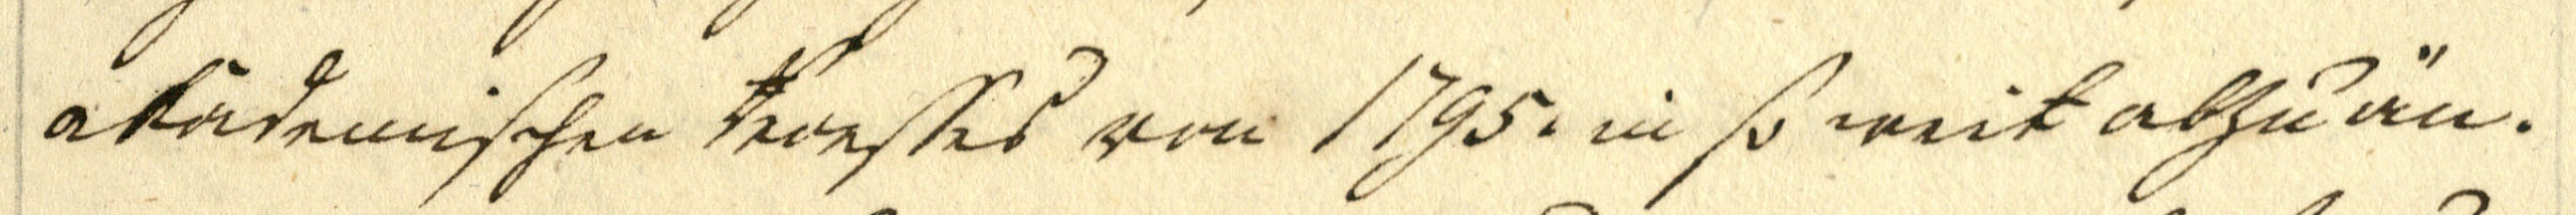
akademischen Recesses von 1795. in so weit abzuän¬
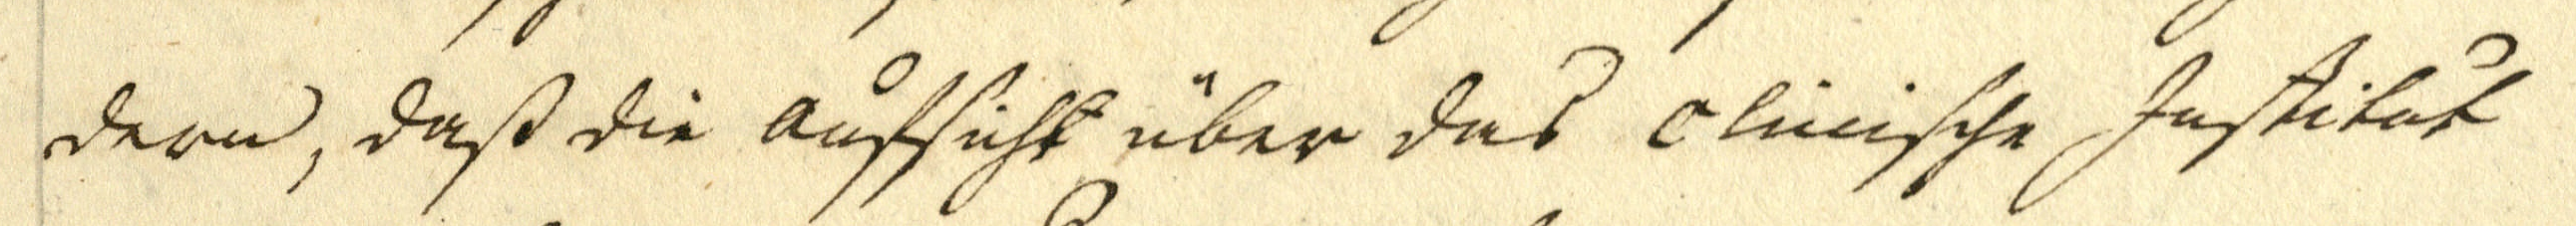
dern, daß die Aufsicht über das clinische Institut
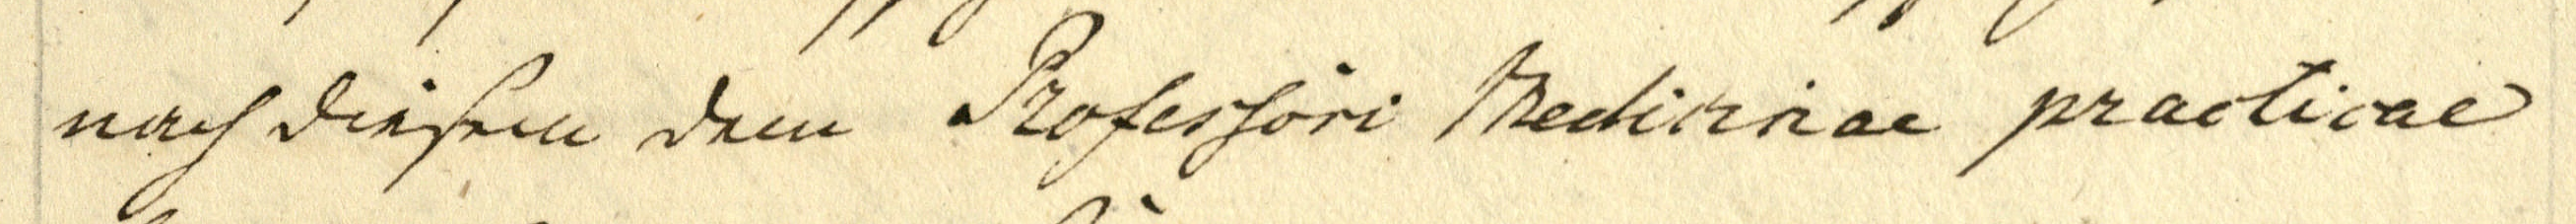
nach diesem dem Professori Medicinae practicae
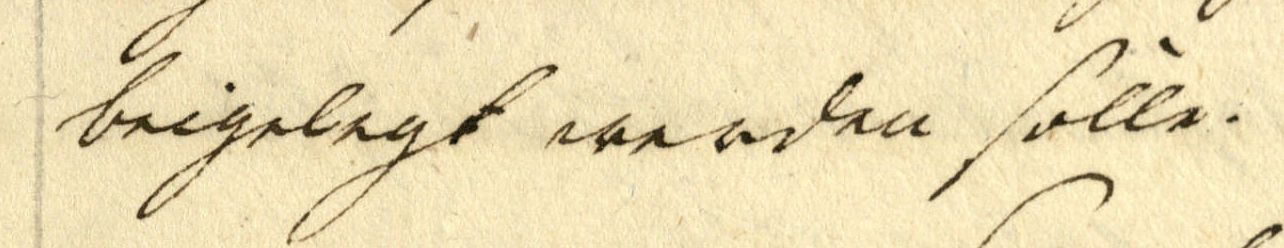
beigelegt werden solle.
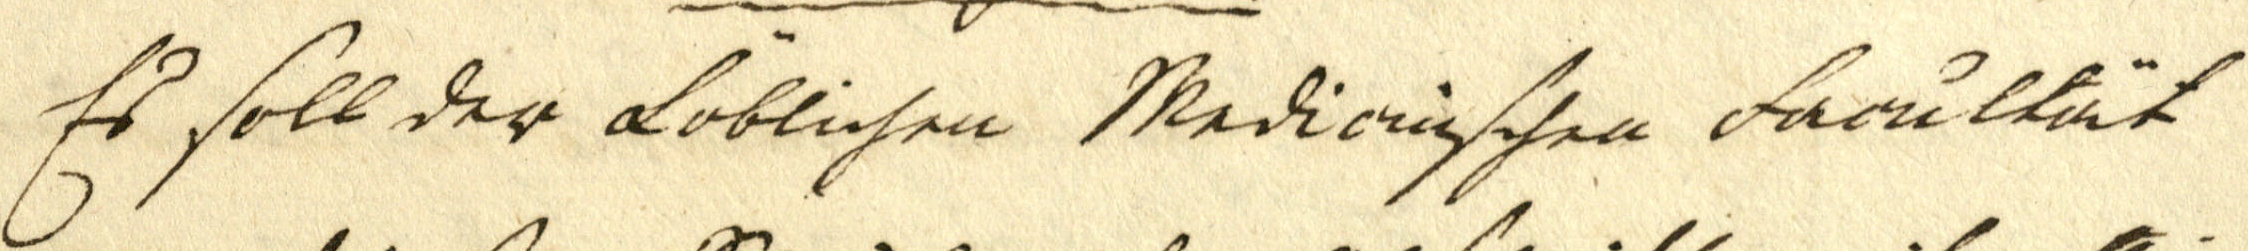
Es soll der Löblichen Medicinischen Facultät
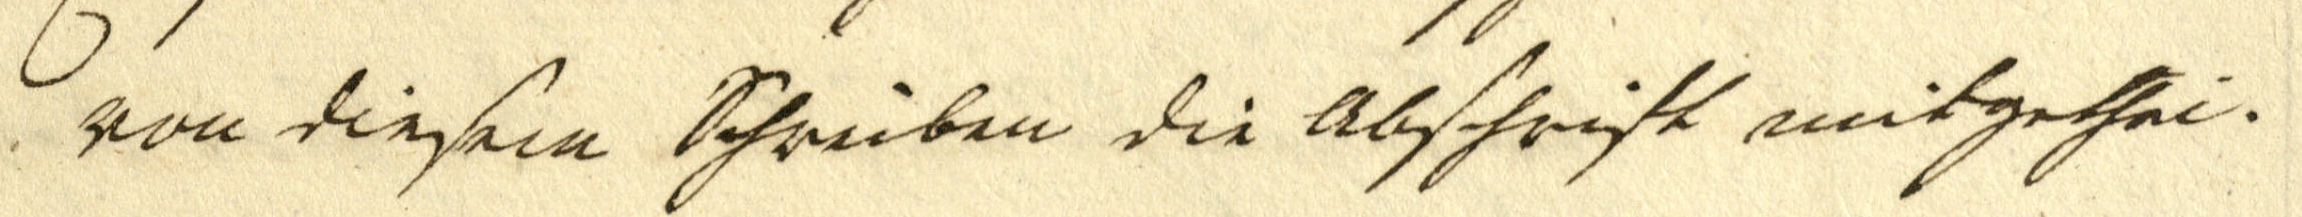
von diesem Schreiben die Abschrift mitgethei¬
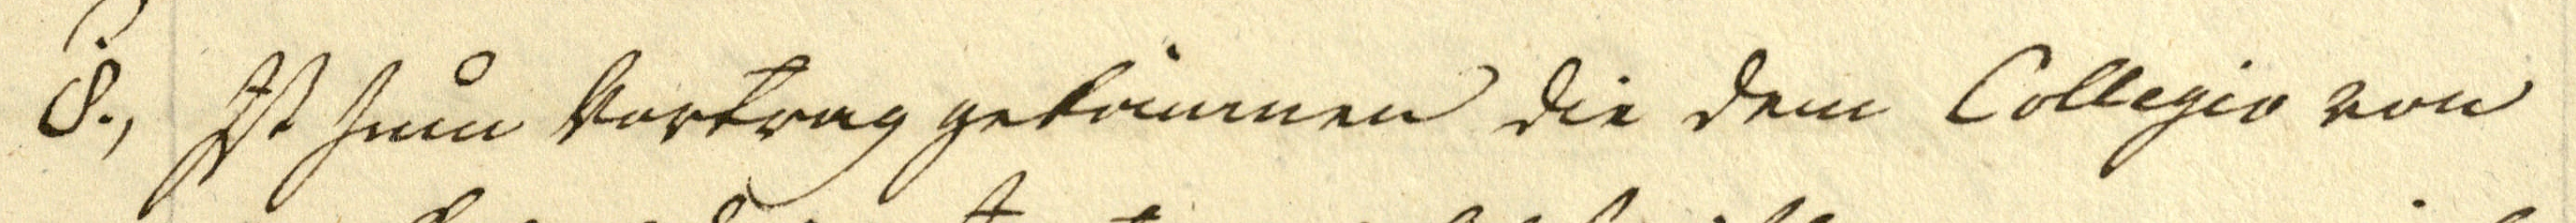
8., Ist zum Vortrag gekommen die dem Collegio von
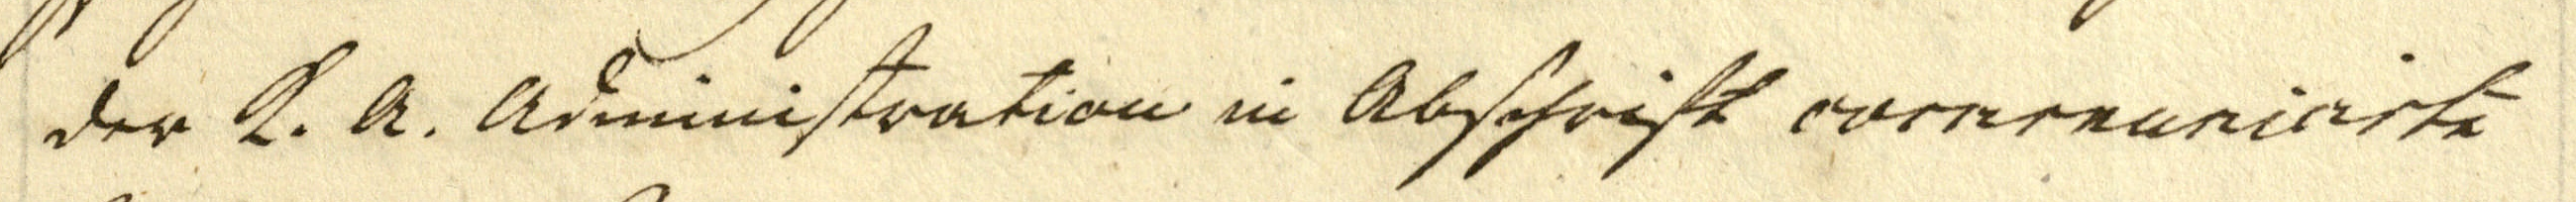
der K. A. Administration in Abschrift communicirte
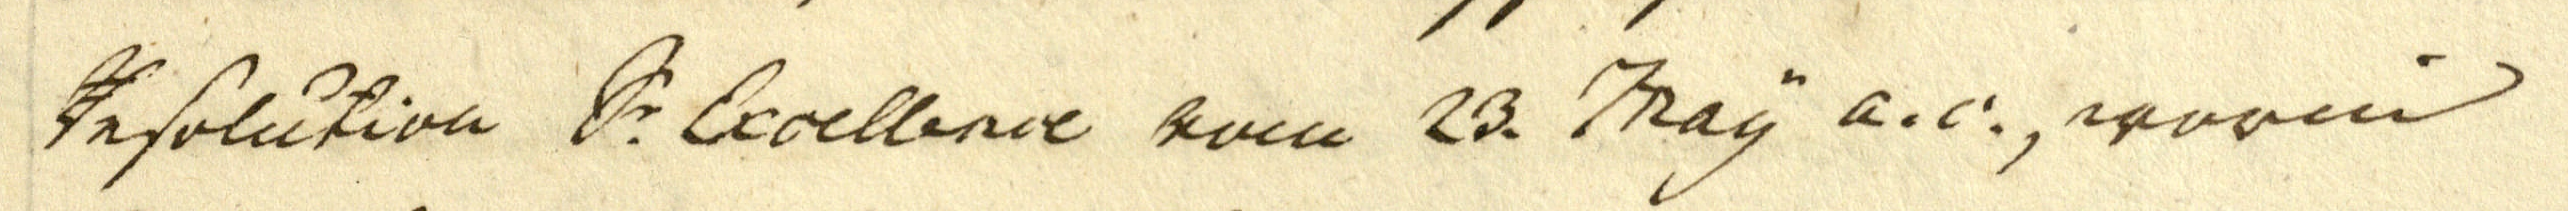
Resolution Sr. Excellence vom 23. Maÿ a. c., worin
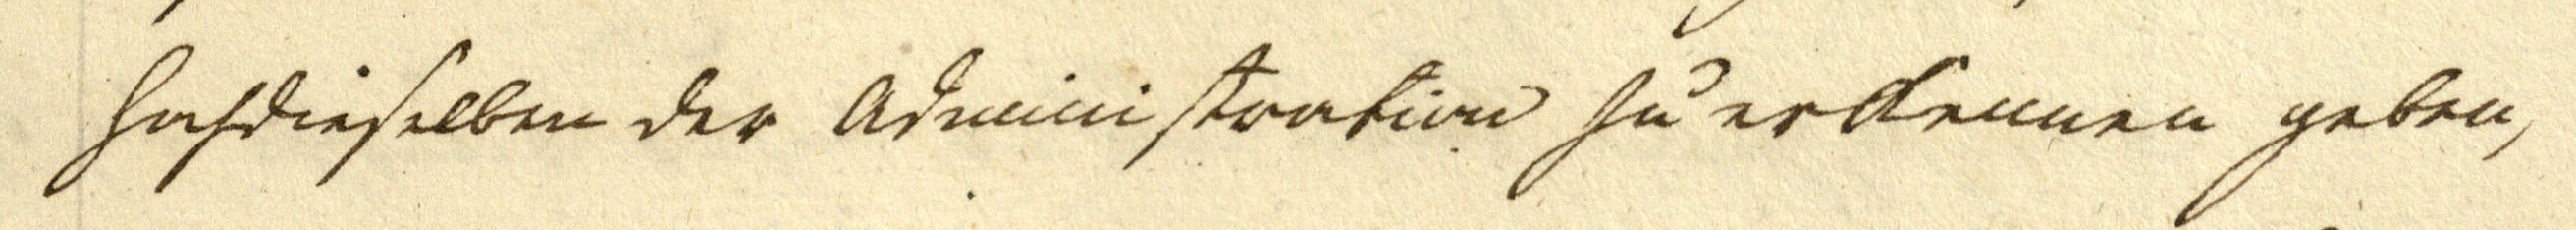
hochdieselben der Administration zu erkennen geben,
